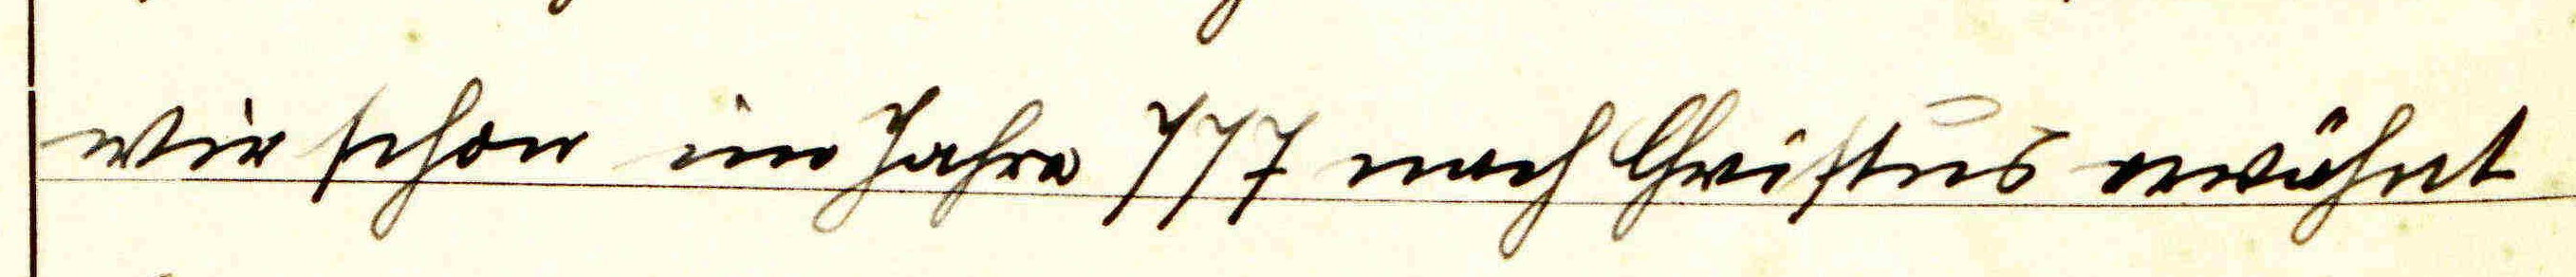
wir schon im Jahre 777 nach Christus erwähnt
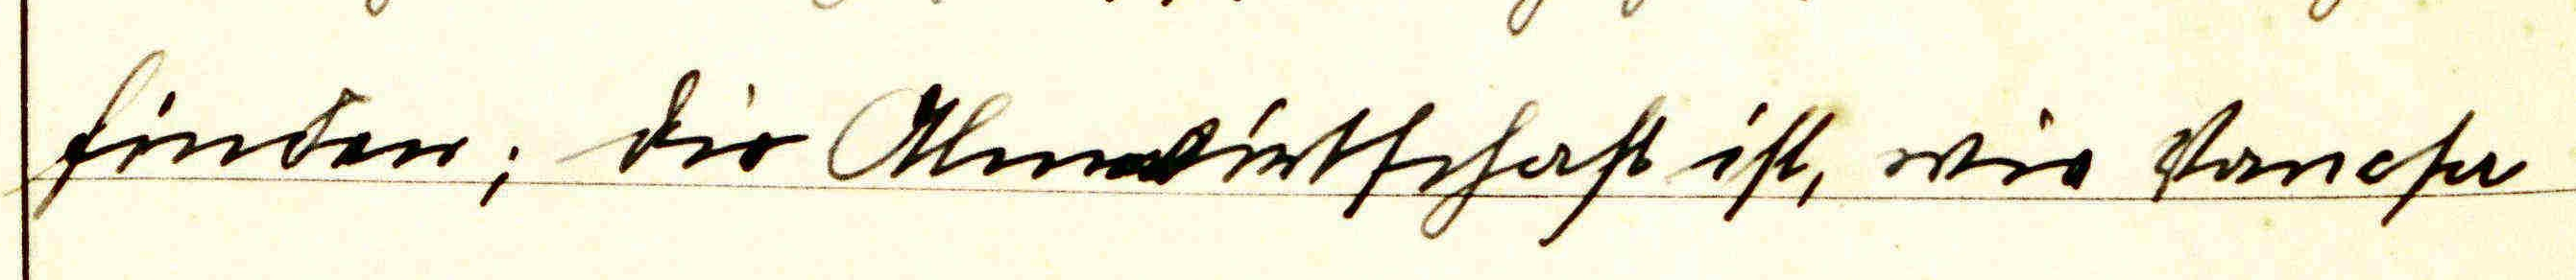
finden; die Almwirtschaft ist, wie Vancsa
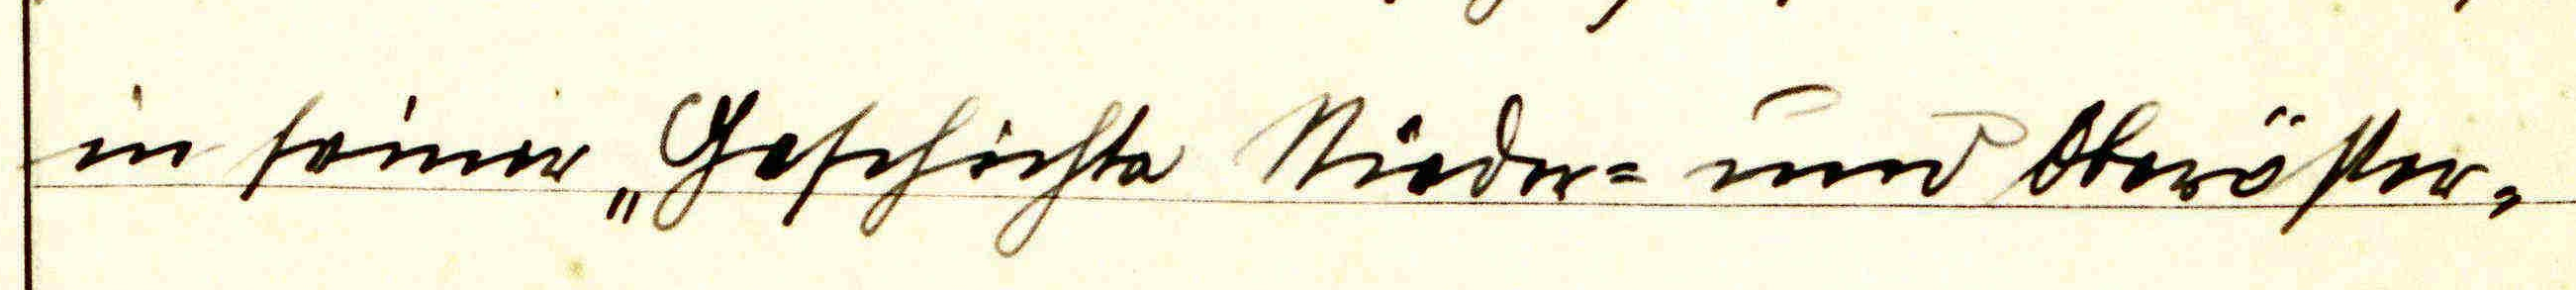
in seiner „Geschichte Nieder- und Oberöster-
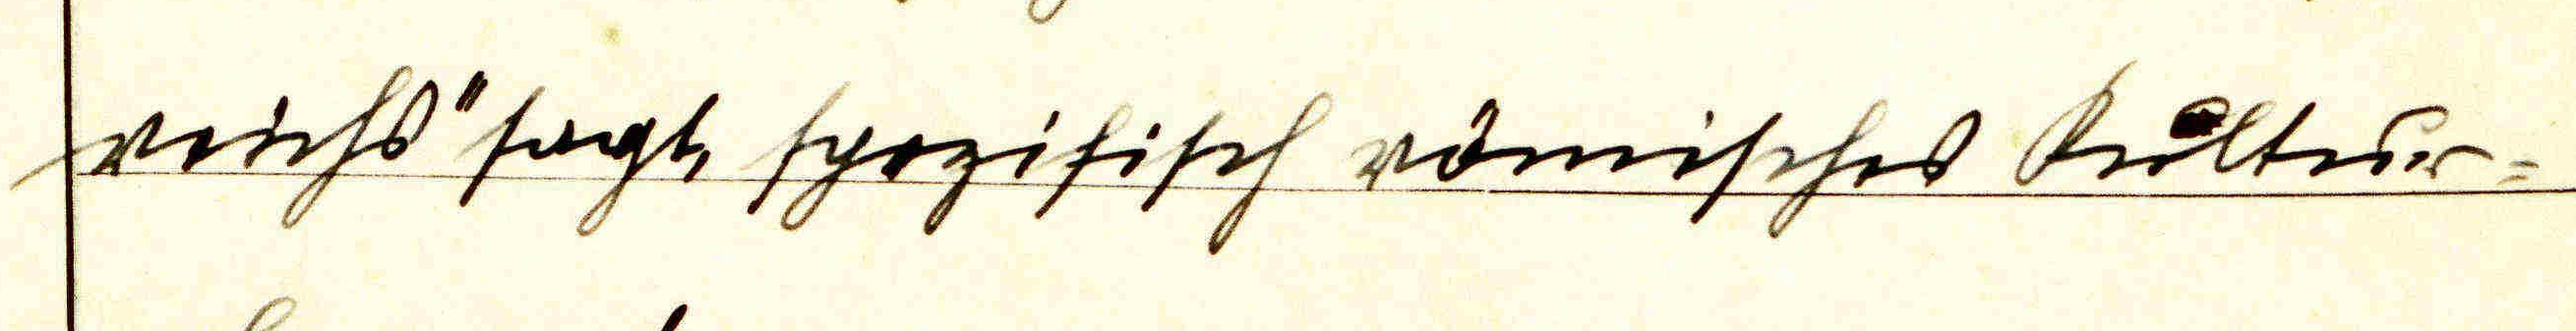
reichs“ sagt, spezifisch römisches Kultur-
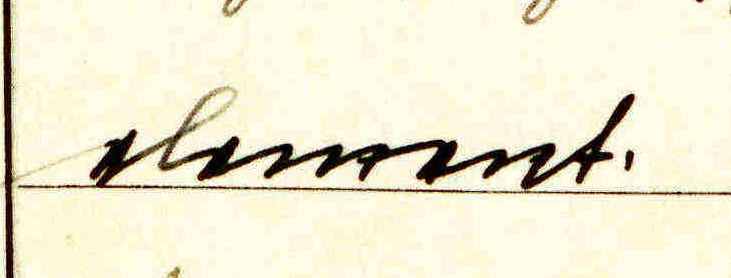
element.
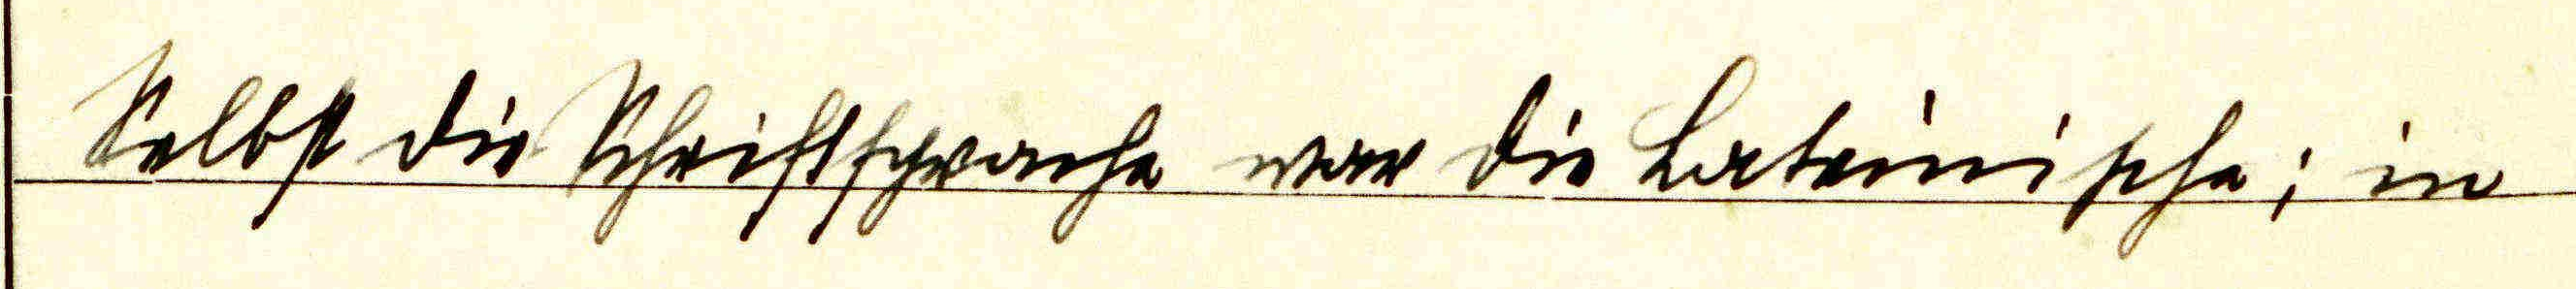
Selbst die Schriftsprache war die Lateinische; in
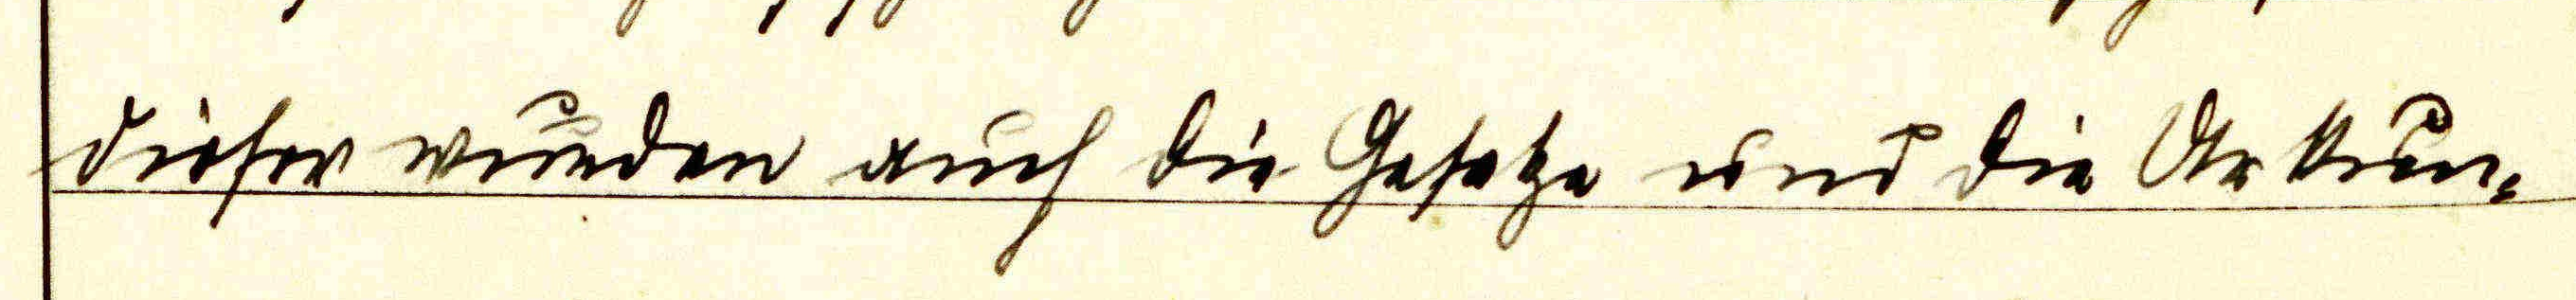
dieser wurden auch die Gesetze und die Urkun-
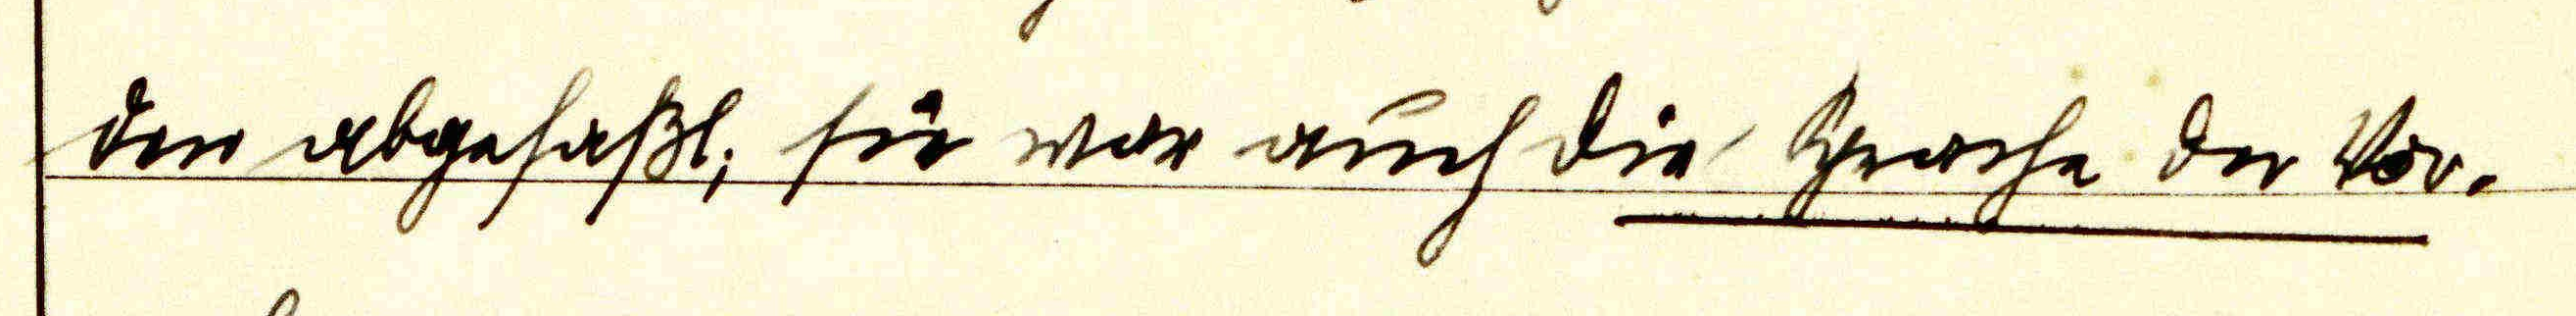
den abgefaßt; sie war auch die Sprache der Vor-
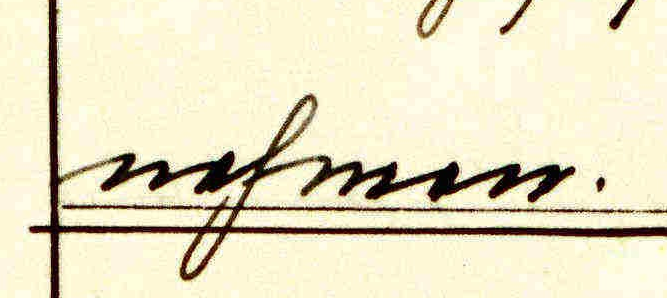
nehmen.
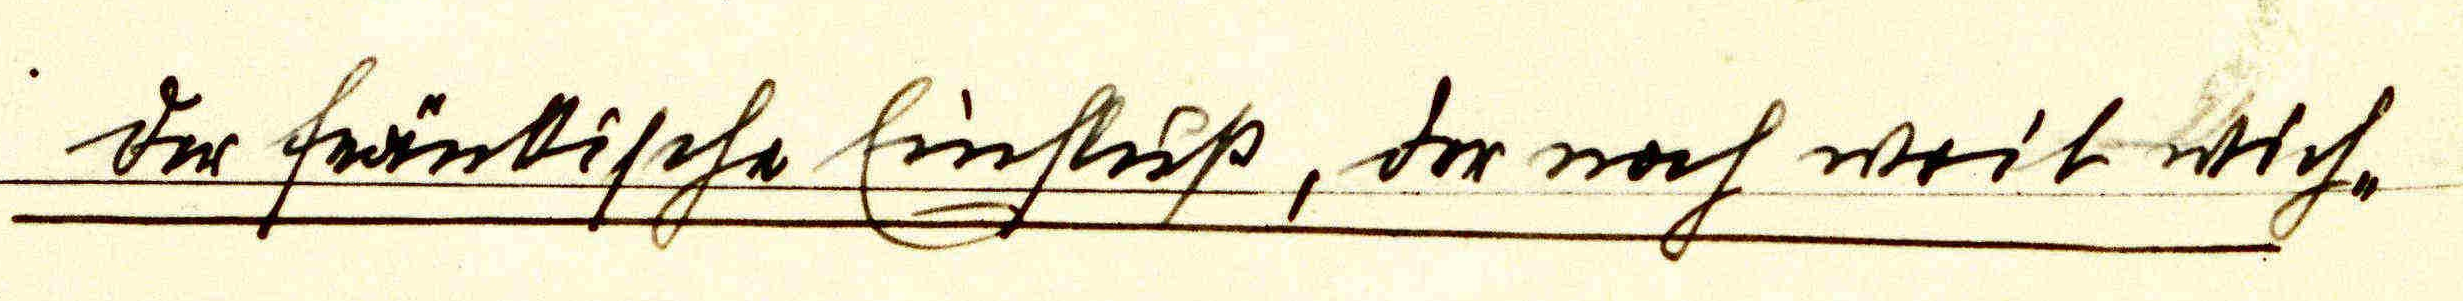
Der fränkische Einfluß, der noch weit wich-
